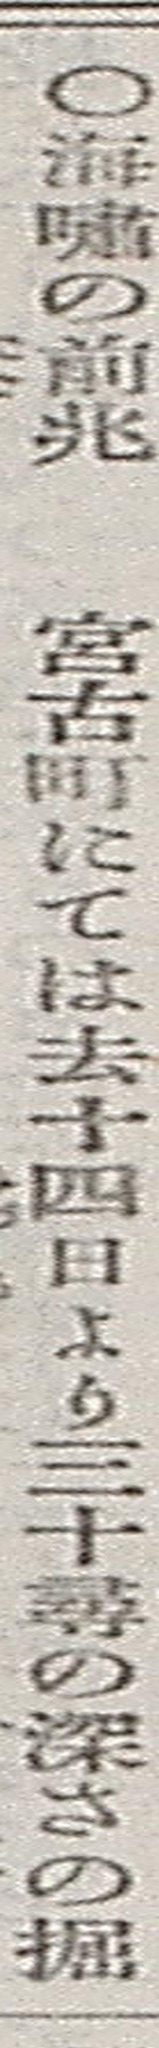○海嘯の前兆宮古町にては去十四日より三十尋の深さの堀
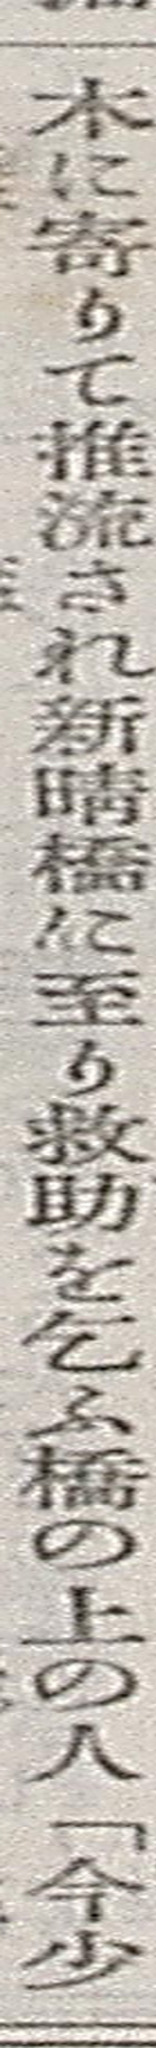木に寄りて推流され新晴橋に至り救助を乞ふ橋の上の人「今少
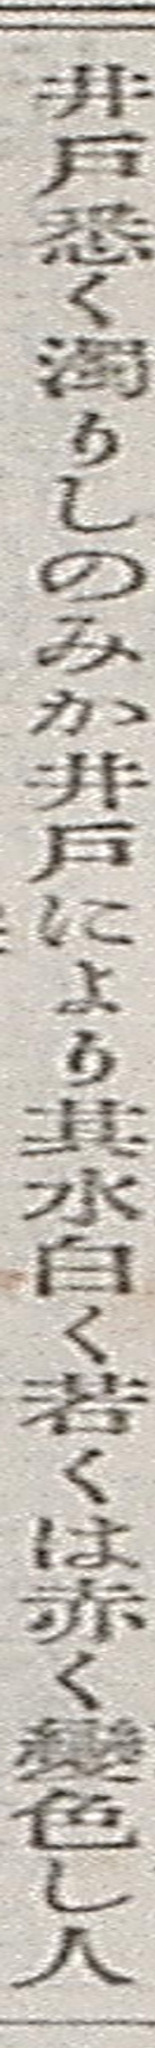井戸悉く濁りしのみか井戸により其水白く若くは赤く変色し人
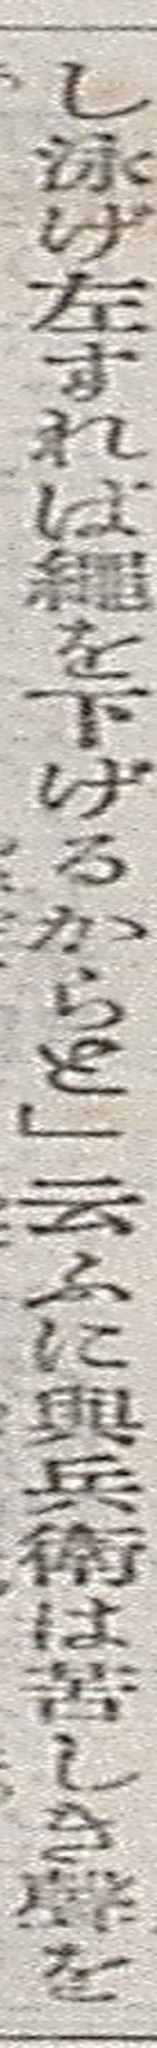し泳げ左すれば縄を下げるからと」云ふに與兵衛は苦しき声を
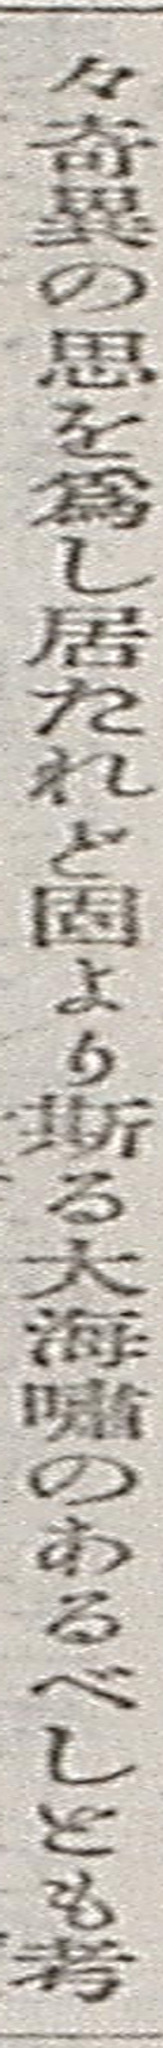々奇異の思を為し居れりと固より斯る大海嘯のあるべしとも考
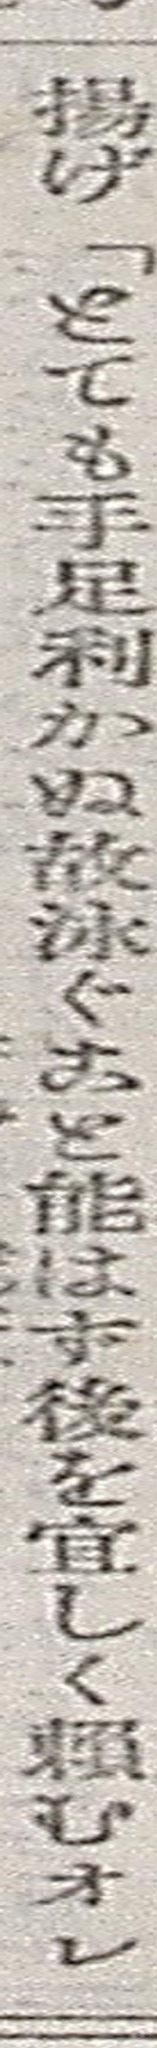揚げ「とても手足利かぬ故泳ぐこと能はず後を宜しく頼むオレ
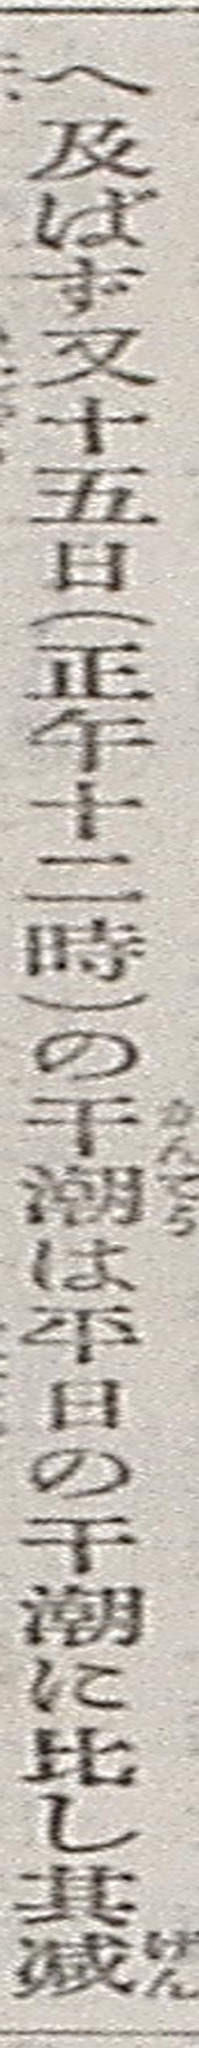へ及ばず又十五日の干潮は平日の干潮に比し其減
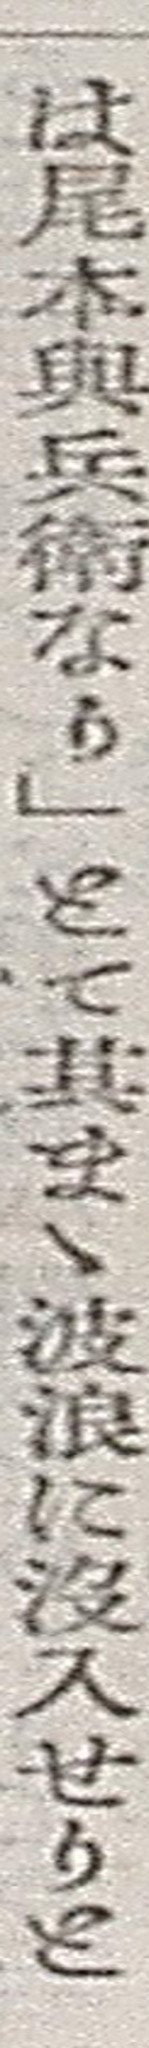は尾本與兵衛なり」とて其まゝ波浪に没入せりと
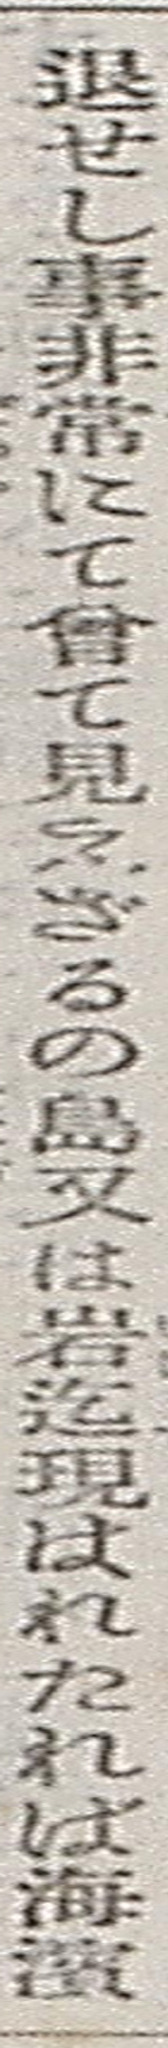退せし事非常にて曾て見えざるの島又は岩迄現はれたれば海浜
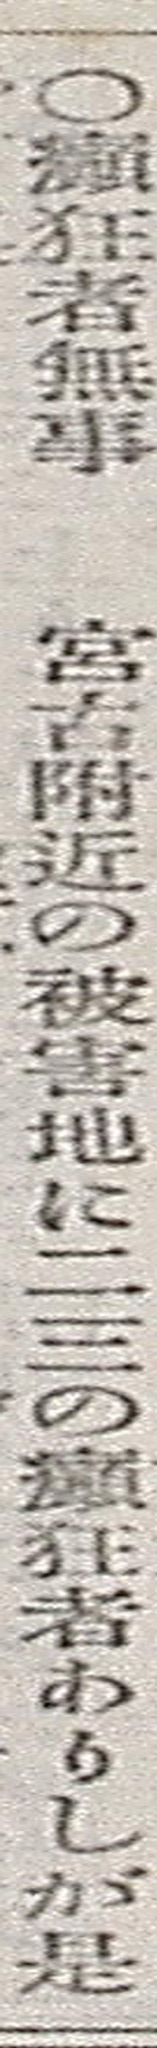○癲狂者無事宮古付近の被害地に二三の癲狂者ありしが是
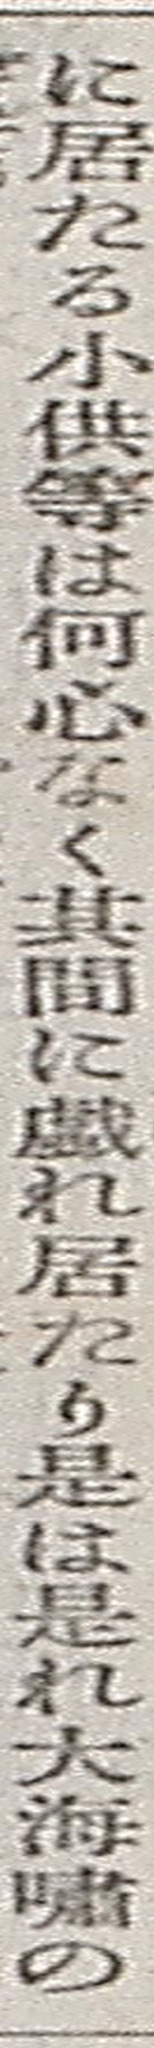に居たる小供等は何心なく其間に戯れ居たり是は是れ大海嘯の
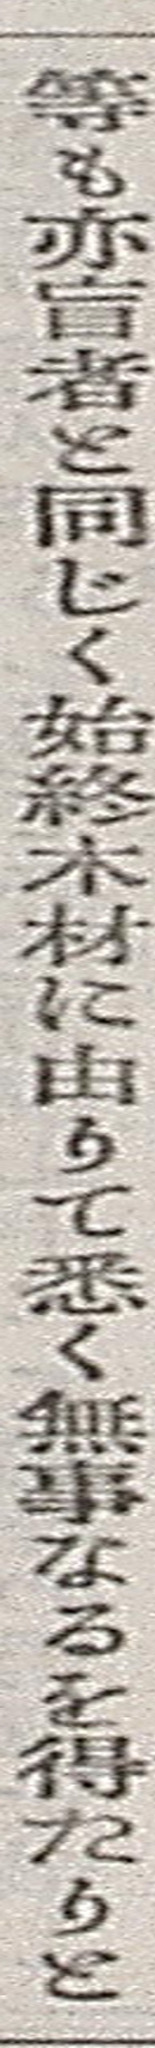等も亦盲者と同じく始終木材に由りて悉く無事なるを得たりと
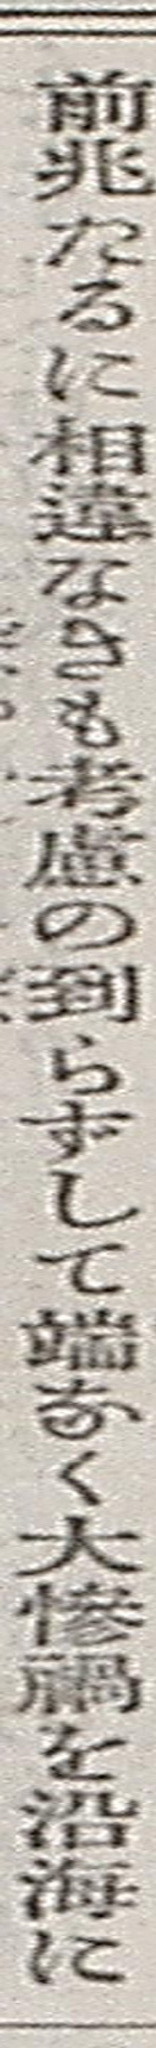前兆なるに相違なきも考慮の到らずして端なく大惨禍を沿海に
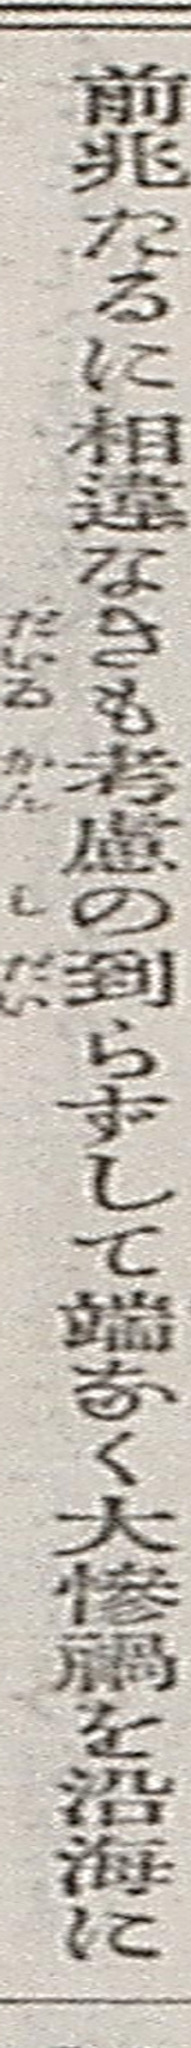前兆なるに相違なきも考慮の到らずして端なく大惨禍を沿海に
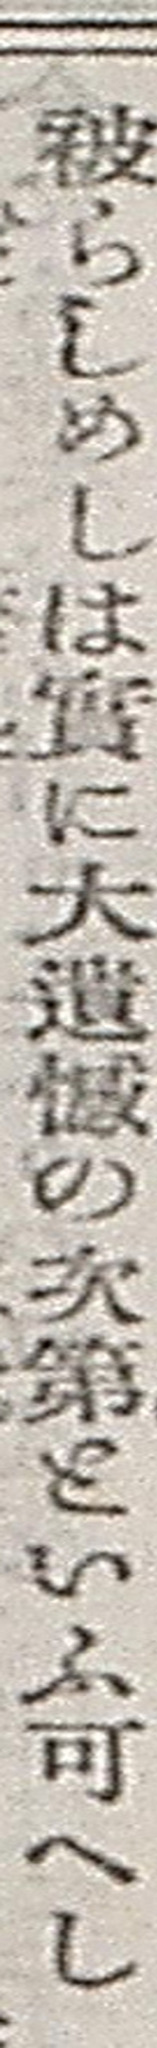被らしめしは実に大遺憾の次第といふ可へし
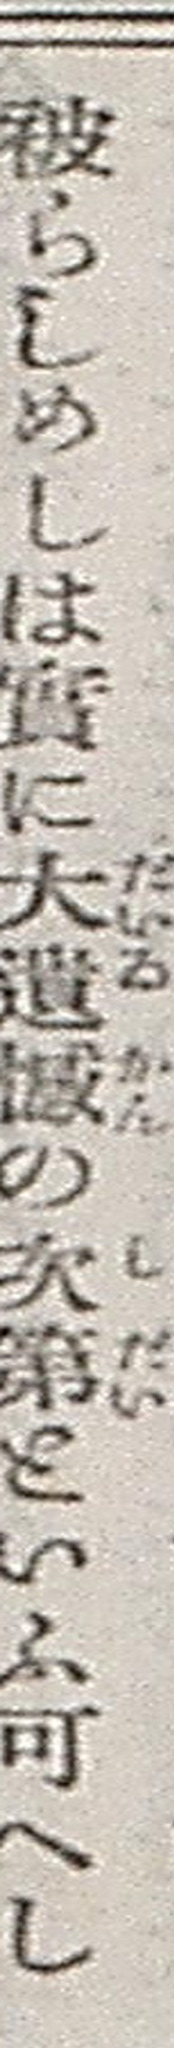被らしめしは実に大遺憾の次第といふ可へし
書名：風俗畫報臨時増刊第百二十號　大海嘯被害録（下）
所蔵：東京大学地震研究所図書室 Earthquake Research Institute Library, The University of Tokyo, JAPAN
